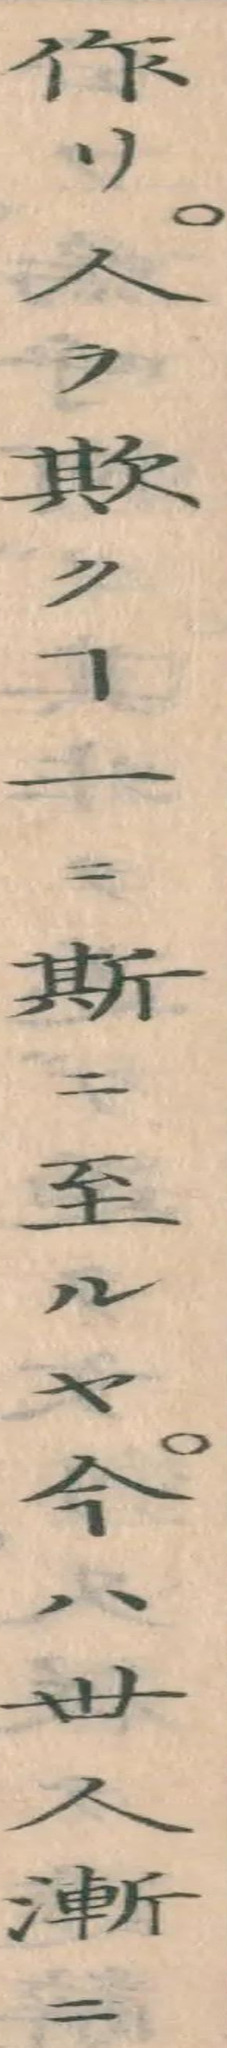作リ。人ヲ欺クヿ一ニ斯ニ至ルヤ。今ハ世人漸ニ
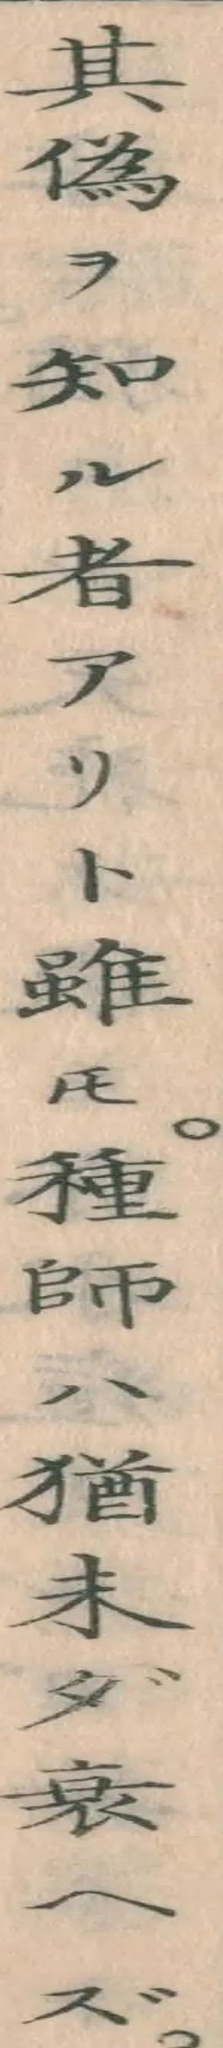其偽ヲ知ル者アリト雖𪜈。種師ハ猶未ダ衰ヘズ。
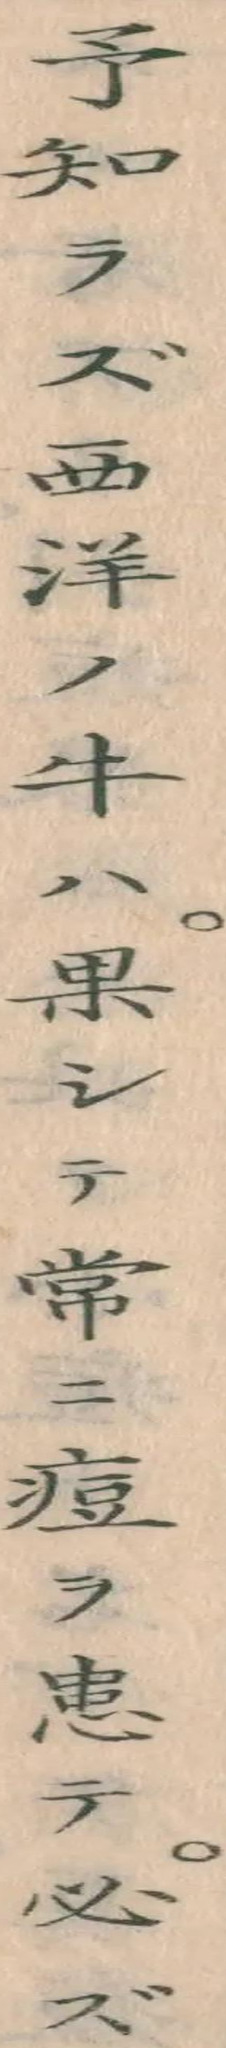予知ラズ西洋ノ牛ハ。果シテ常ニ痘ヲ患テ。必ズ
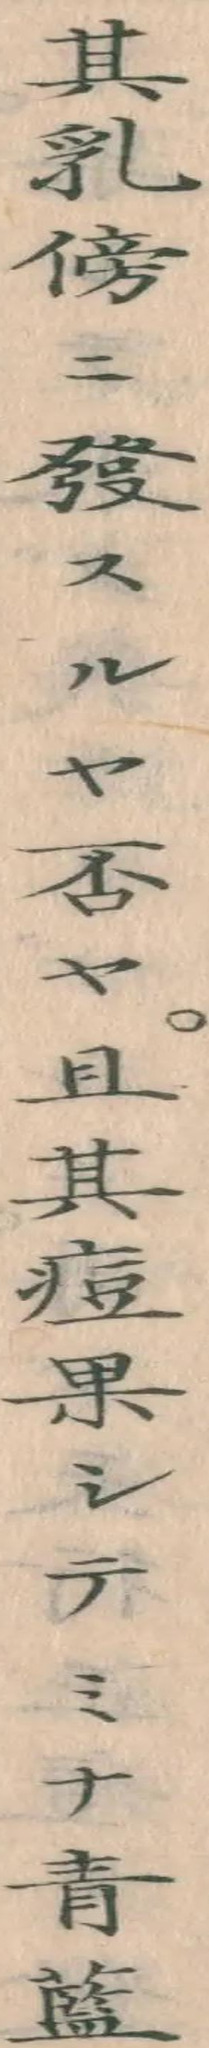其乳傍ニ発スルヤ否ヤ。且其痘果シテミナ青藍
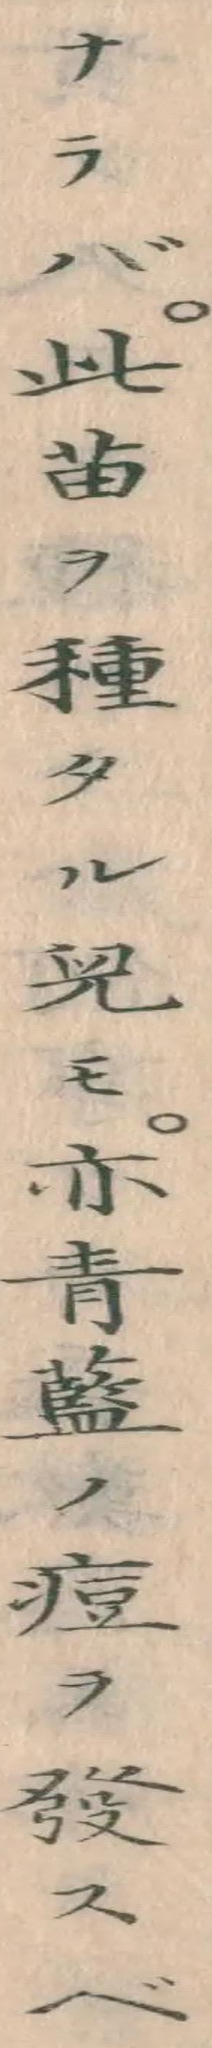ナラバ。此苗ヲ種タル児モ。亦青藍ノ痘ヲ発スベ
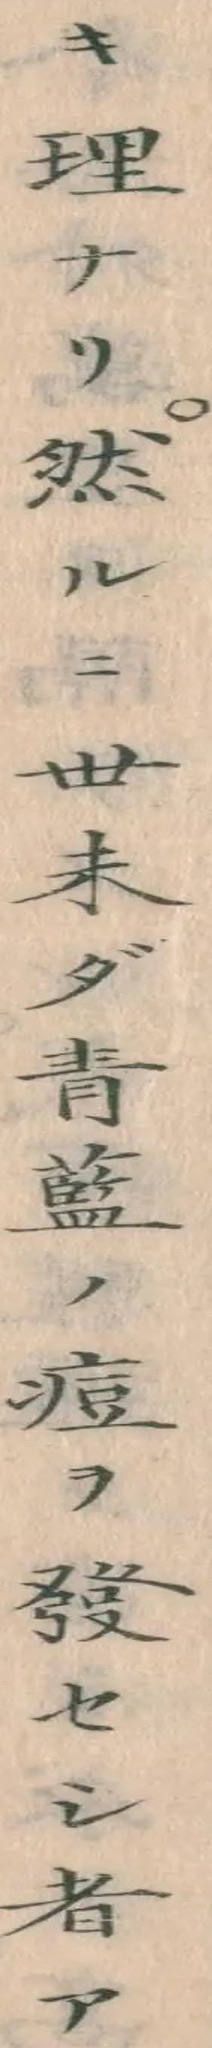キ理ナリ。然ルニ世未ダ青藍ノ痘ヲ発セシ者ア
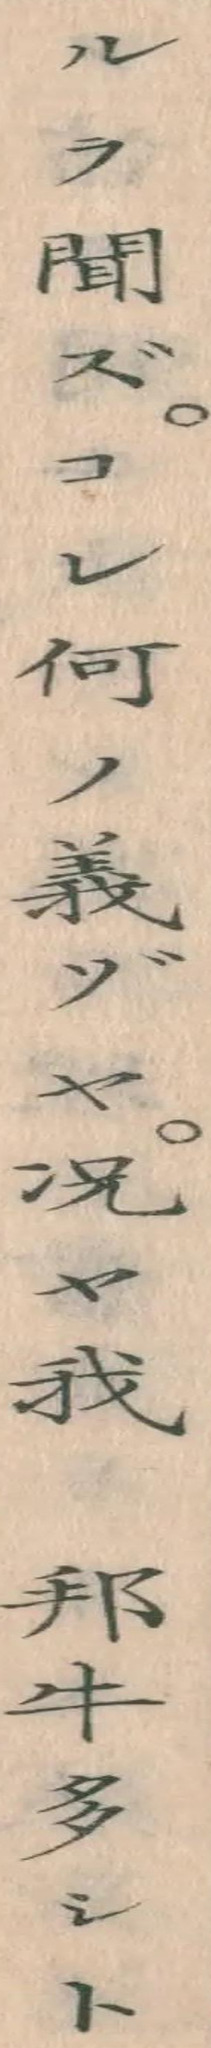ルヲ聞ズ。コレ何ノ義ゾヤ。況ヤ我邦牛多シト
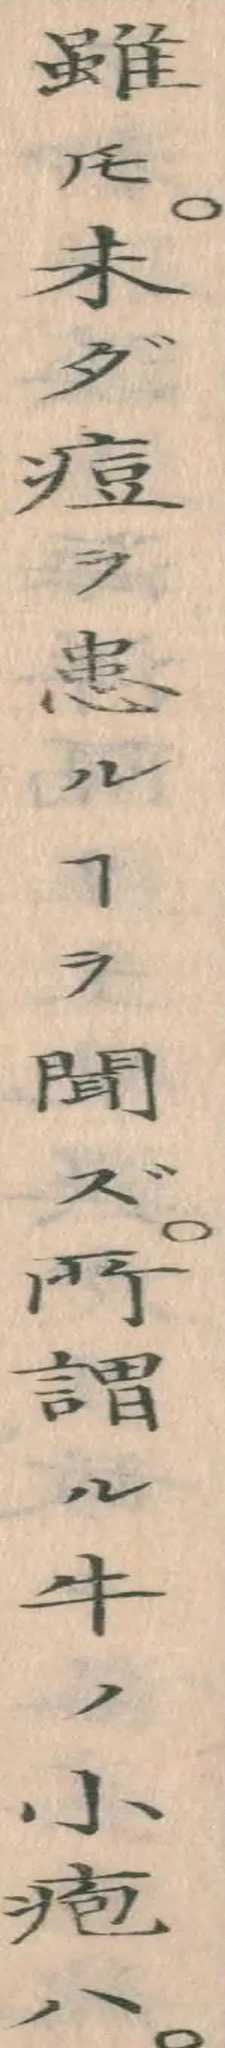雖𪜈。未ダ痘ヲ患ルヿヲ聞ズ。所謂ル牛ノ小疱ハ。
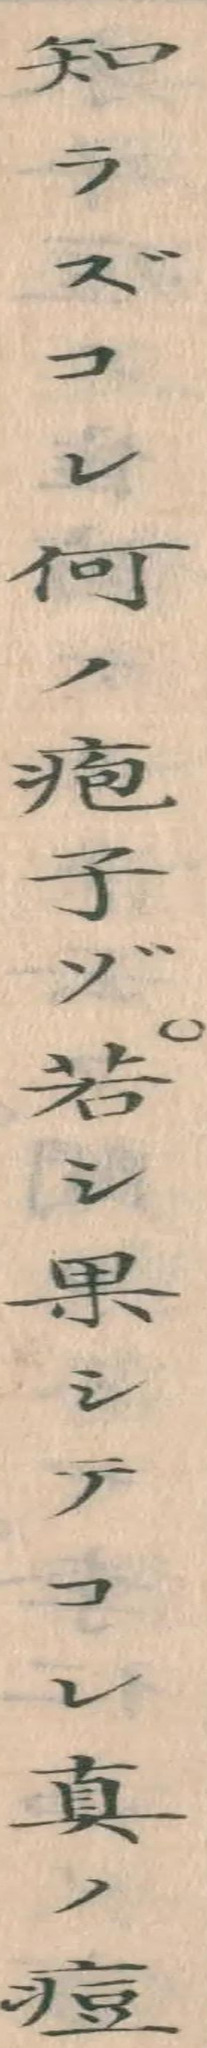知ラズコレ何ノ疱子ゾ。若シ果シテコレ真ノ痘
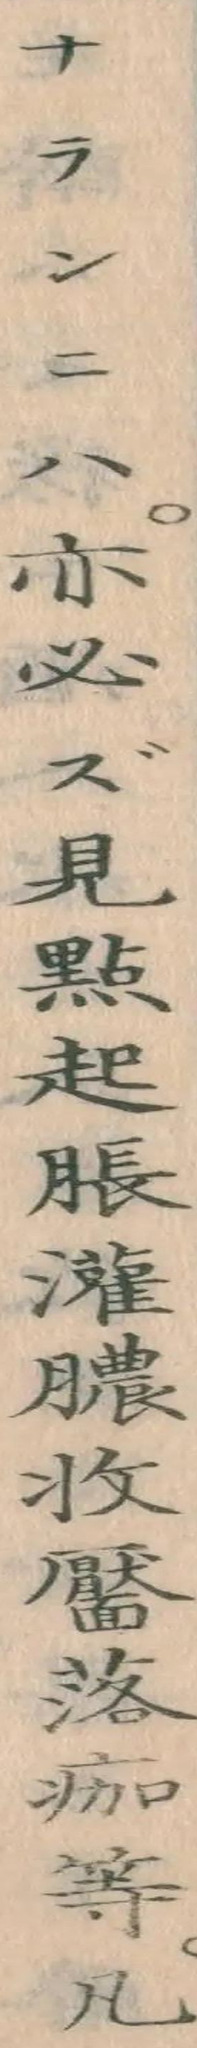ナランニハ。亦必ズ見点起脹灌膿状靨落痂等。凡
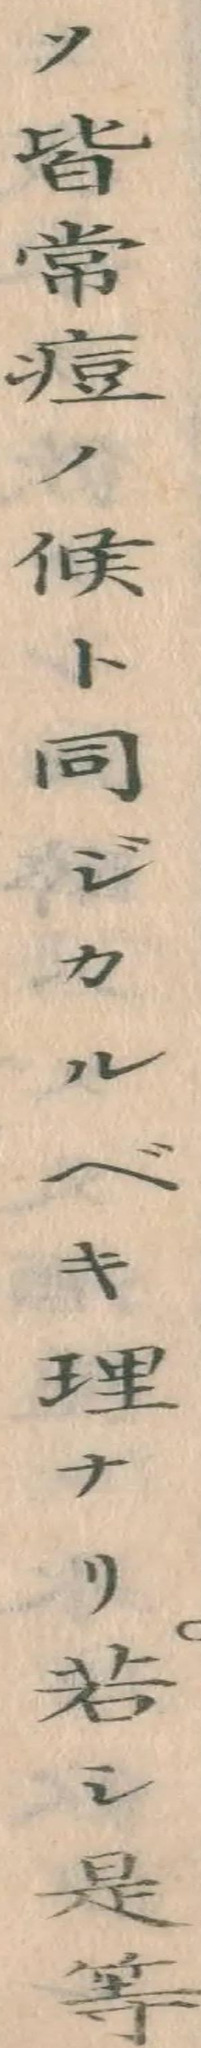ソ皆常痘ノ候ト同ジカルベキ理ナリ。若シ是等
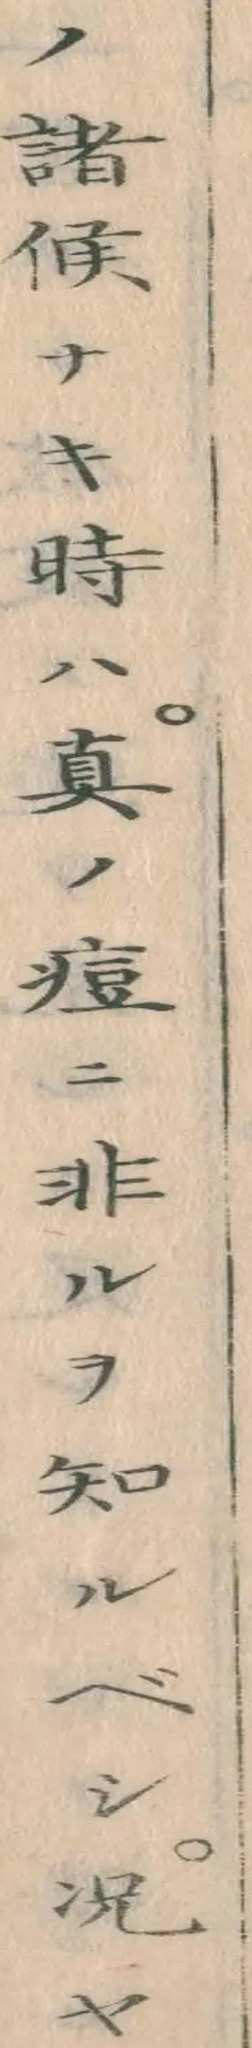ノ諸候ナキ時ハ。真ノ痘ニ非ルヲ知ルベシ。況ヤ
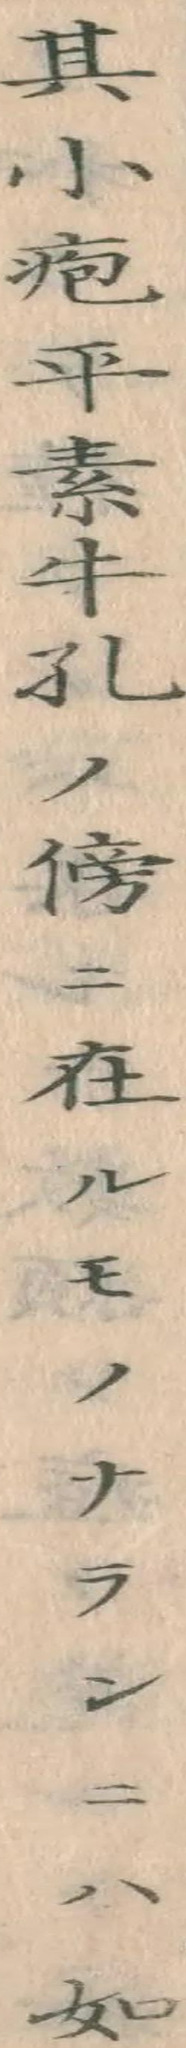其小疱平素牛孔ノ傍ニ在ルモノナランニハ。如
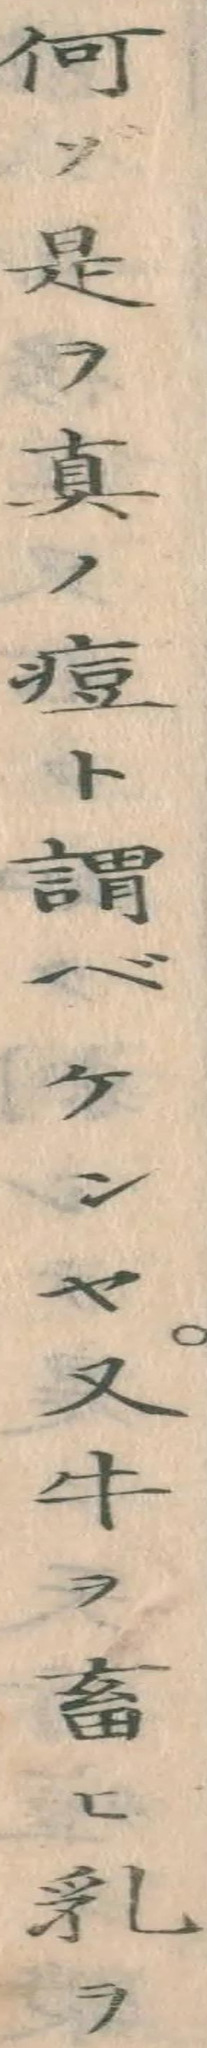何ゾ是ヲ真ノ痘ト謂ベケンヤ。又牛ヲ畜ヒ乳ヲ
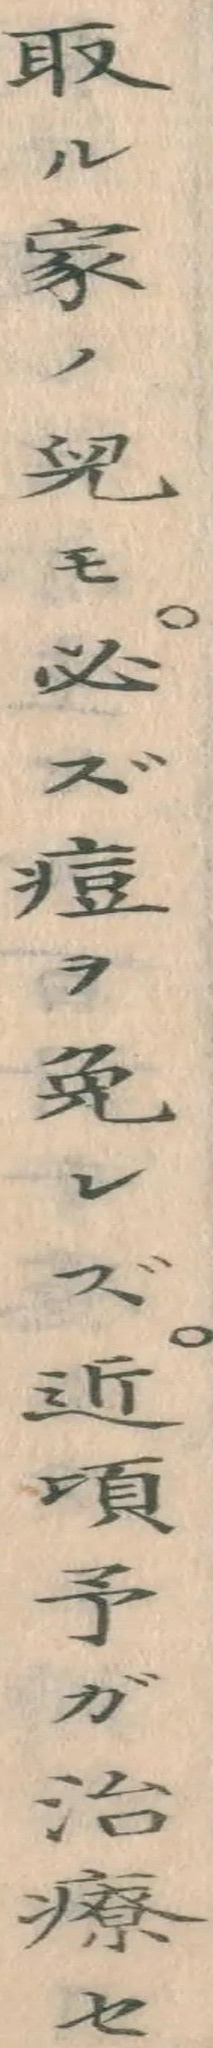取ル家ノ児モ。必ズ痘ヲ免レズ。近頃予ガ治療セ
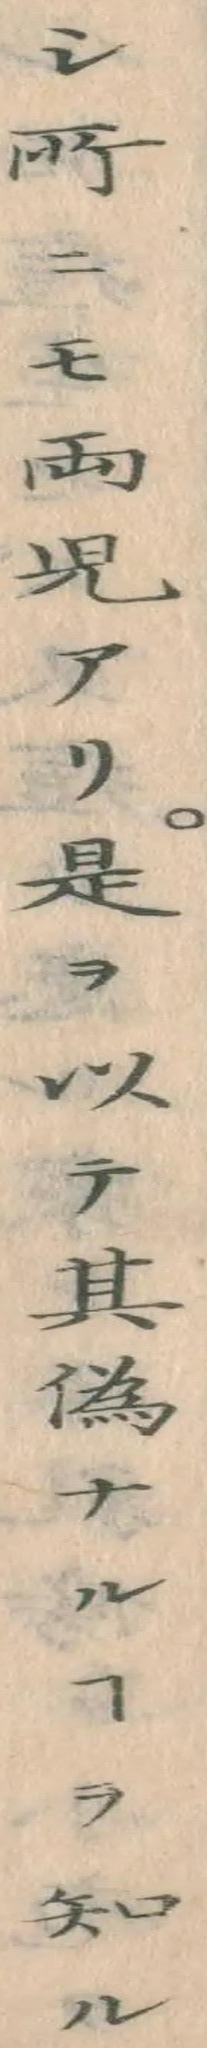シ所ニモ両児アリ。是ヲ以テ其偽ナルヿヲ知ル
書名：種痘弁義
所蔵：国立国会図書館 National Diet Library, JAPAN
